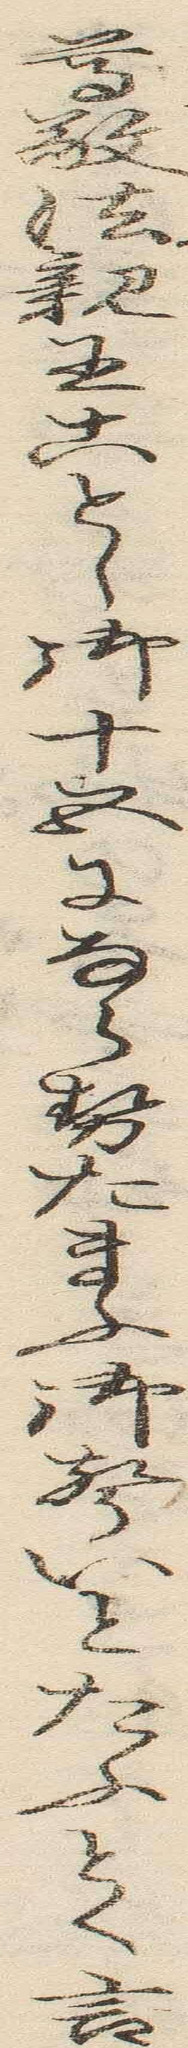尊敬法親王ことし御十五にならせたまふ御聲いとたふとく言
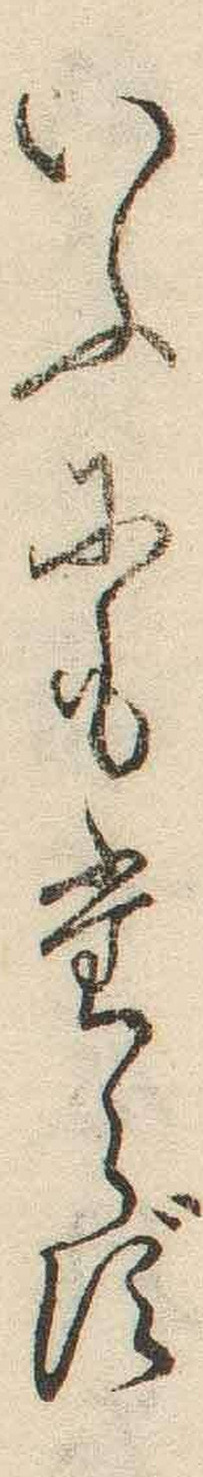いふにもたらず
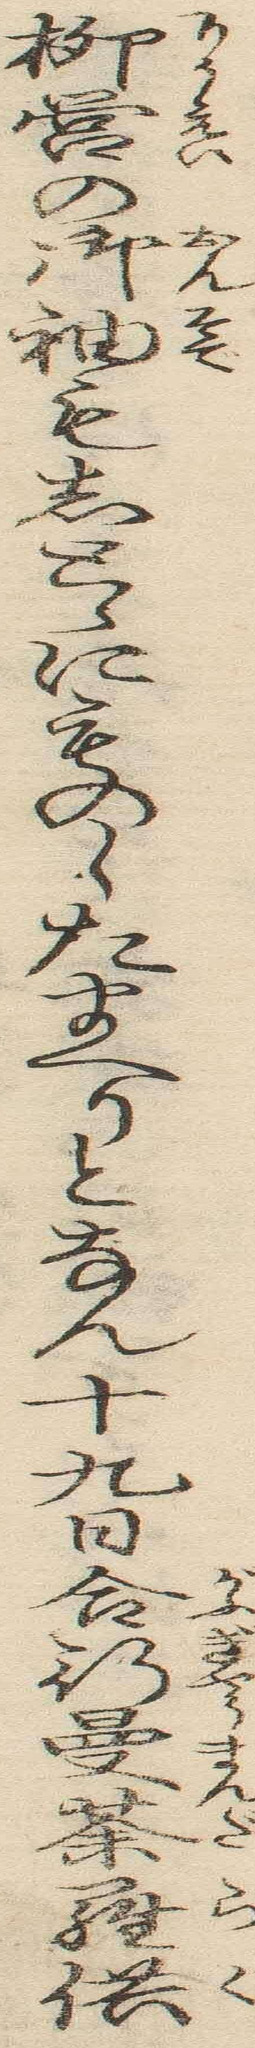柳営の御袖もしとゝにものしたまへりとなん十九日合行曼荼羅供

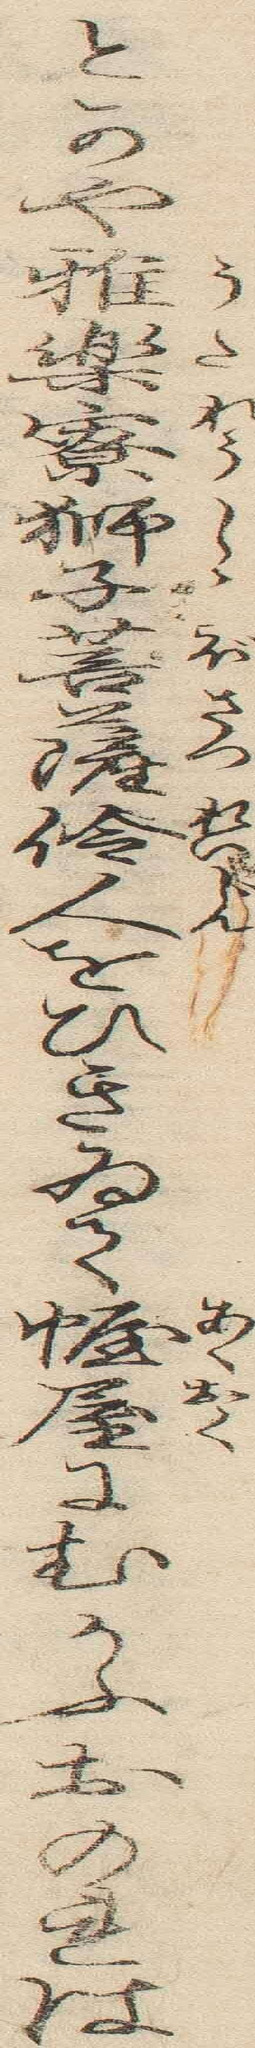とかや雅樂寮獅子菩薩伶人をひきゐて幄屋にむかふおのれは
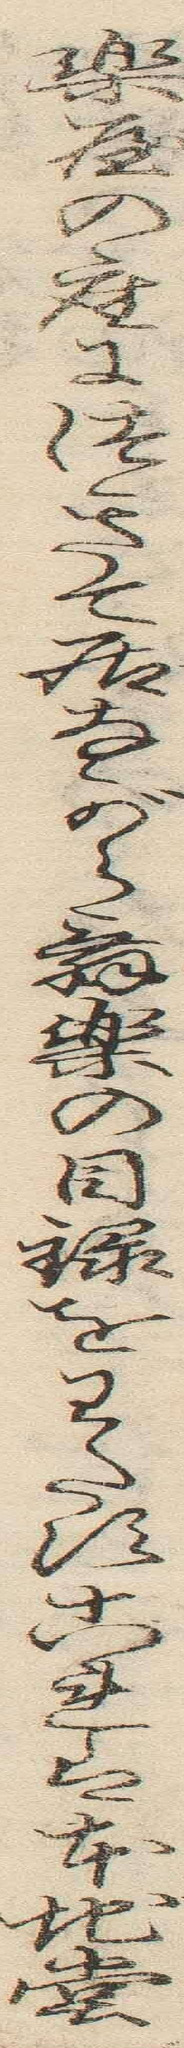樂屋の座につきて居ながら舞樂の目録をわたすこれは本地堂
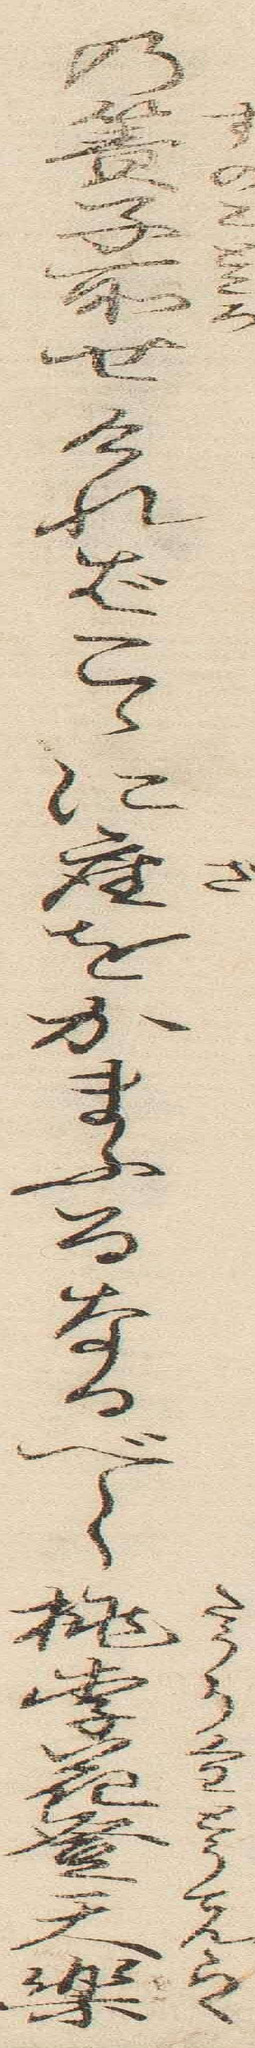の簀子所せければこゝに座をかまふるなるべし桃李花登天樂
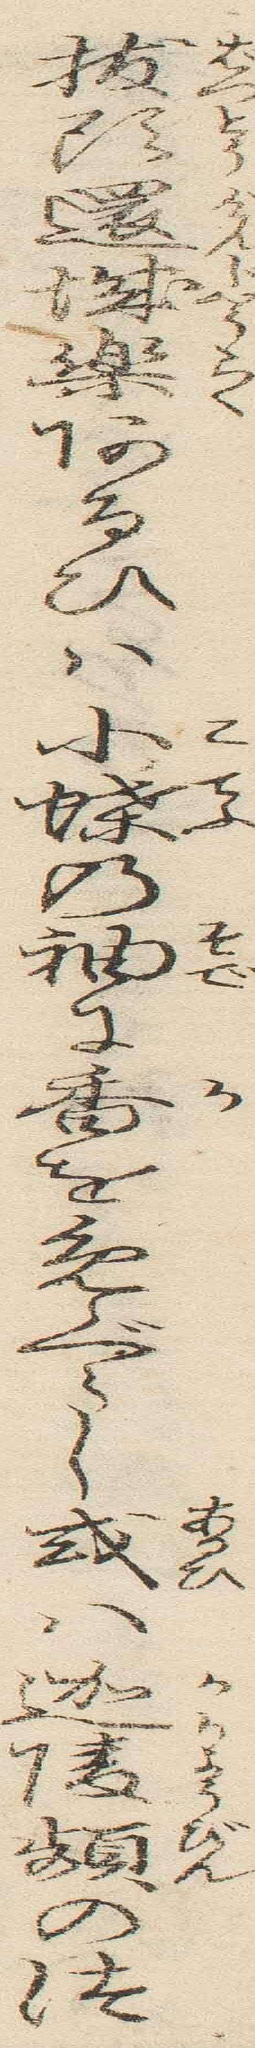拔頭還城樂あるひは小蝶の袖に香をめぐらし或は迦陵頻のつ
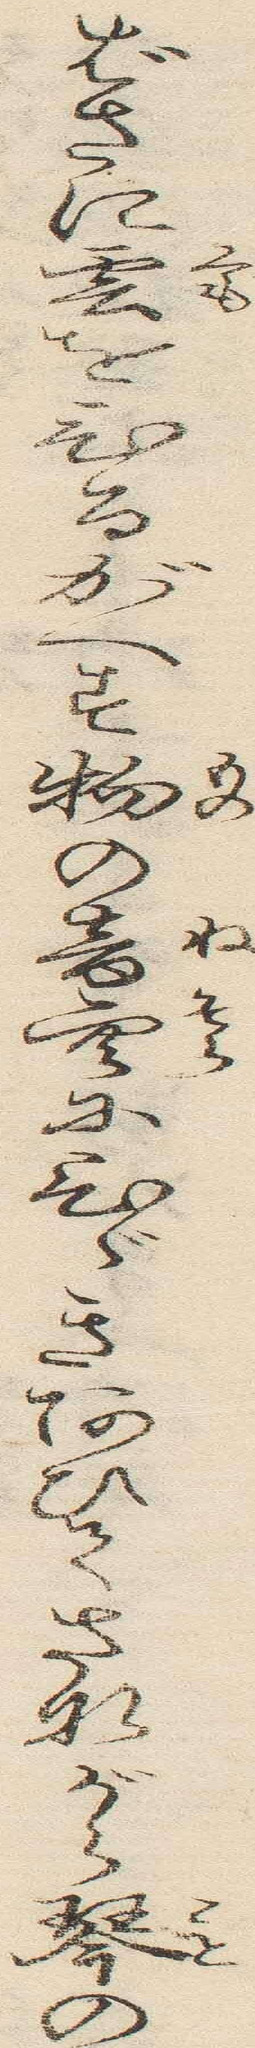ばさに雲をひるがへす物の音空にひゞきあひてさながら琴の
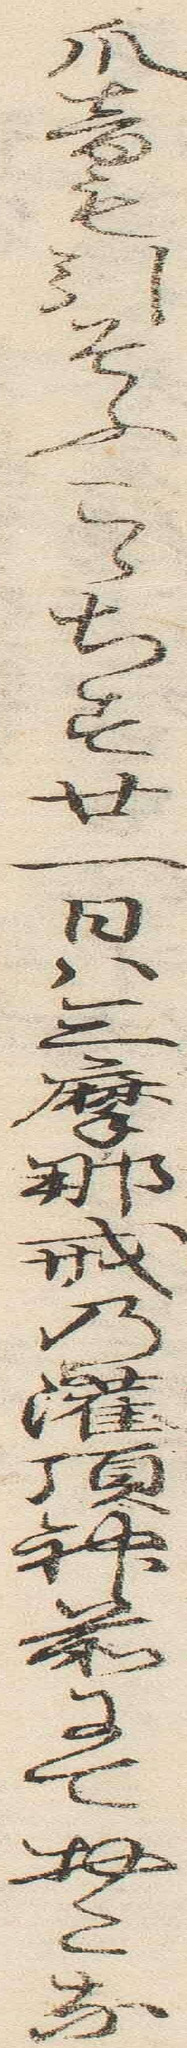爪音も引そふこゝちす廿一日は三摩耶戒の灌頂神前にておこな
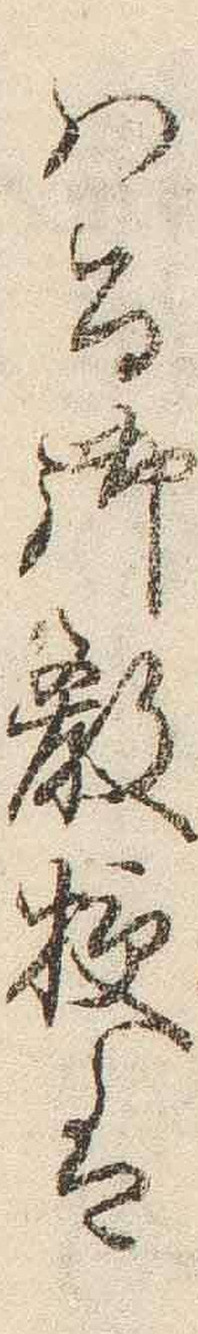はる御敎授は
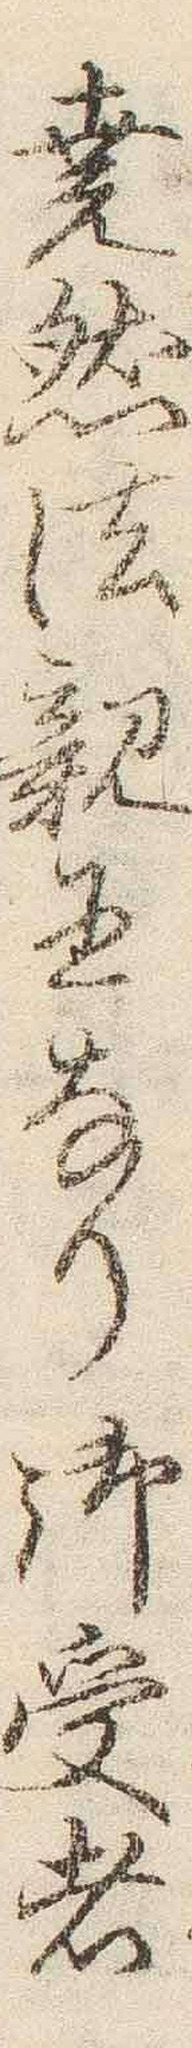尭然法親王なり御受者
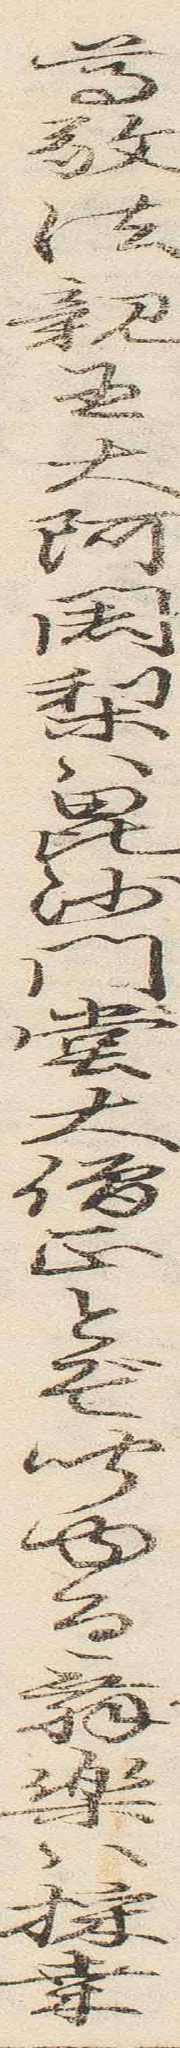尊敬法親王大阿闍梨は毘沙門堂大僧正とぞ聞ゆる舞樂は採桒
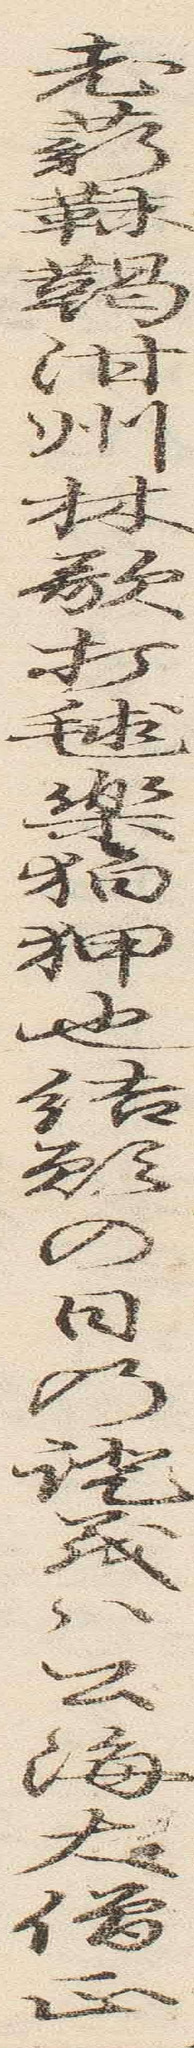老薪靺鞨泔州林歌打毬樂狛狎也結願の日の證義は公海大僧正
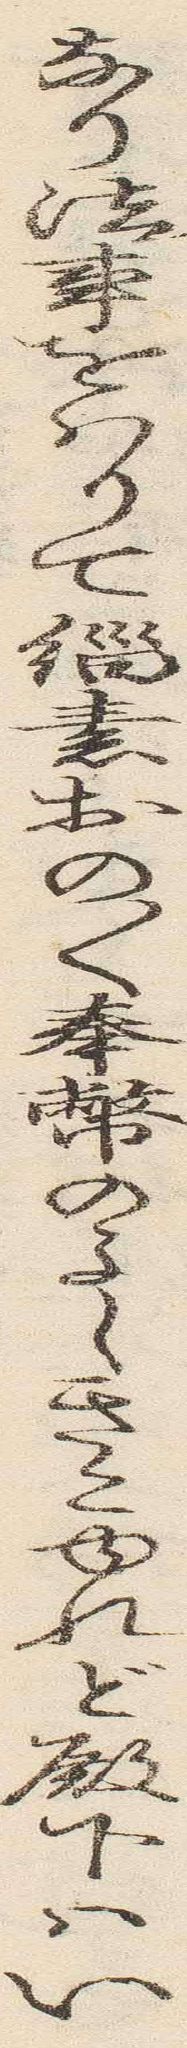なり法事をはりて緇素おの〳〵奉幣のよしきこゆれど殿下はい
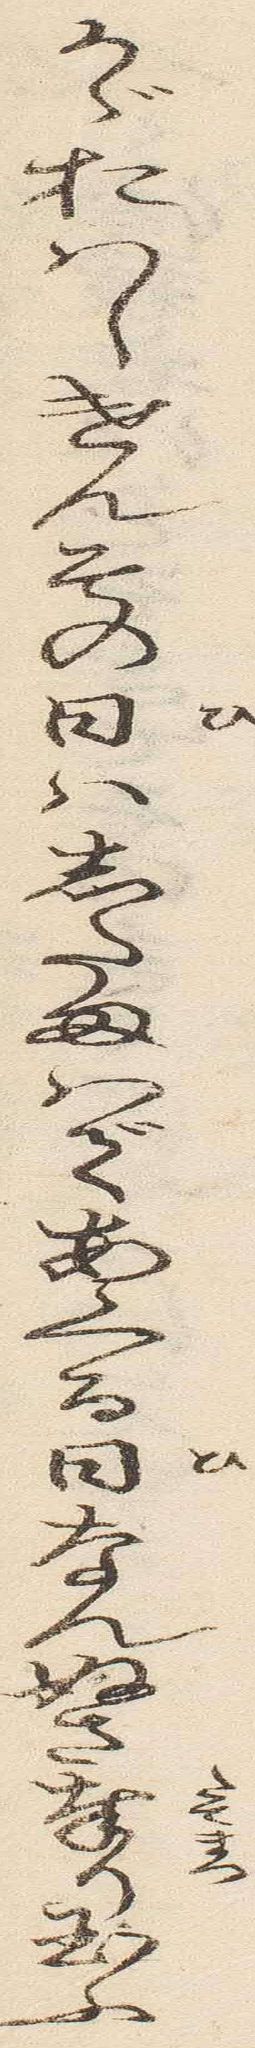かゞおはしけんその日はしたまはであくる日なんぬさ奉り玉ふ
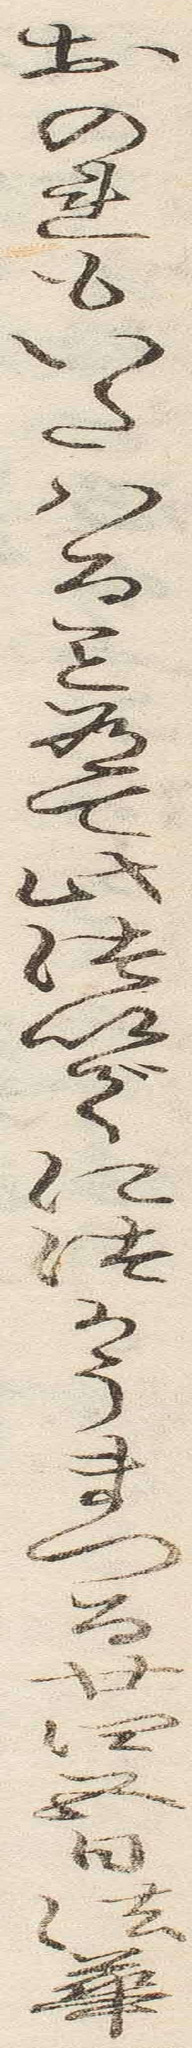おのれもいたはること有て此ついでにつかうまつる廿四五日法蕐
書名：日光山志
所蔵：東京学芸大学附属図書館 国文学研究資料館
